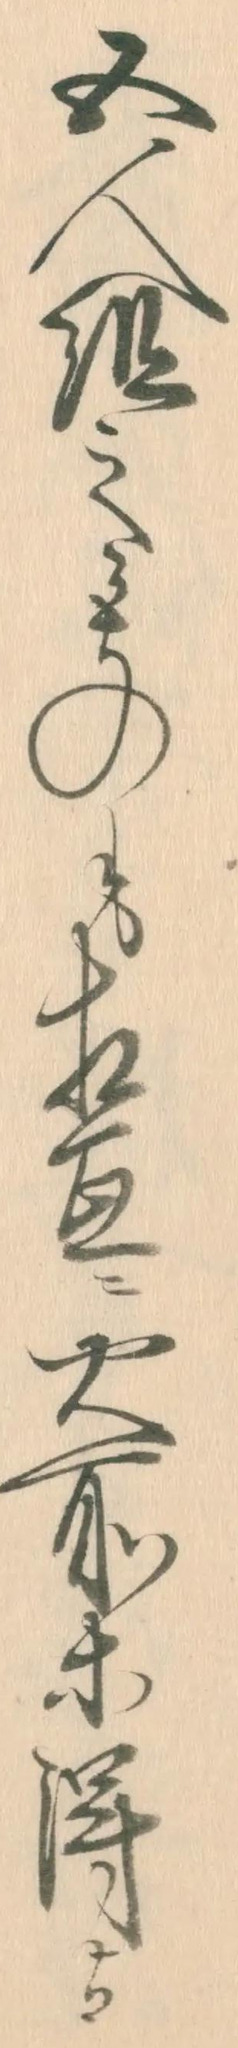五人組之ものも相互ニ火所等得と
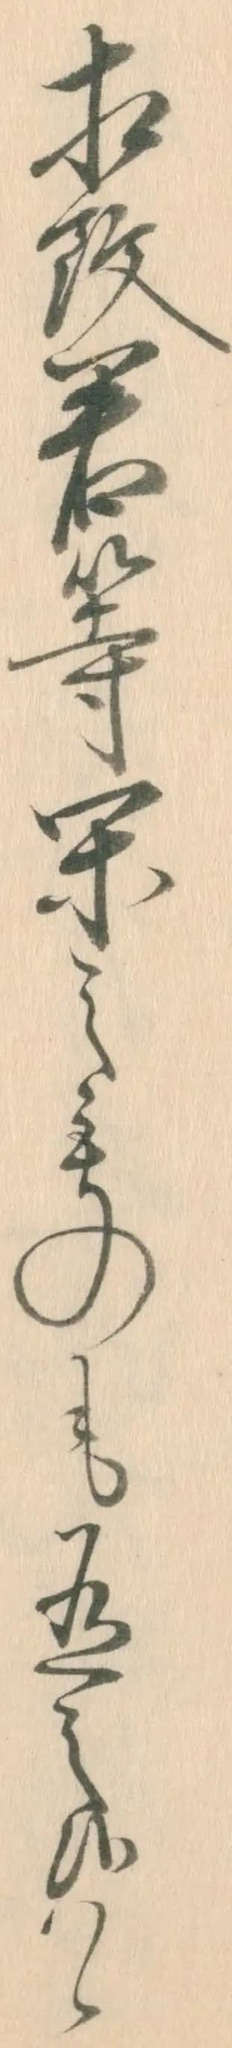相改若等閑之ものも有之候ハヽ
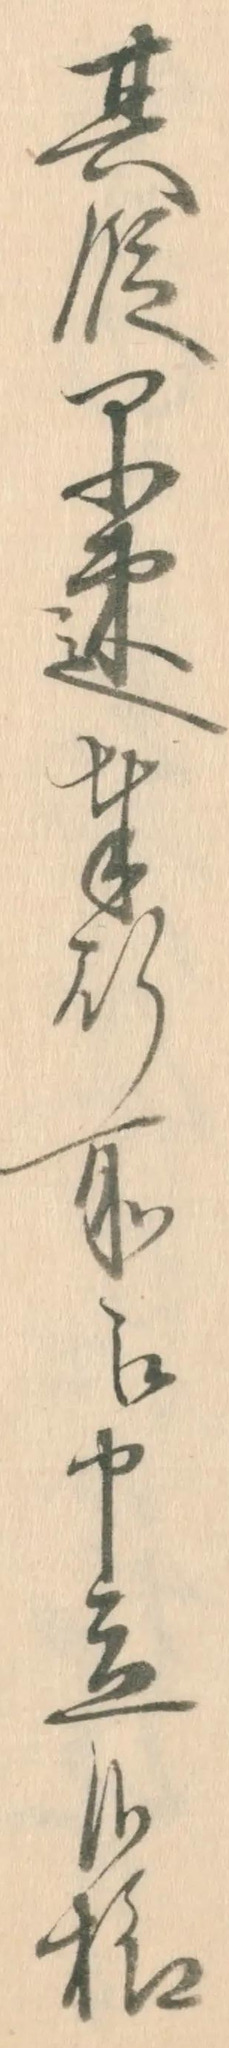其段早速奉行所え申立候様
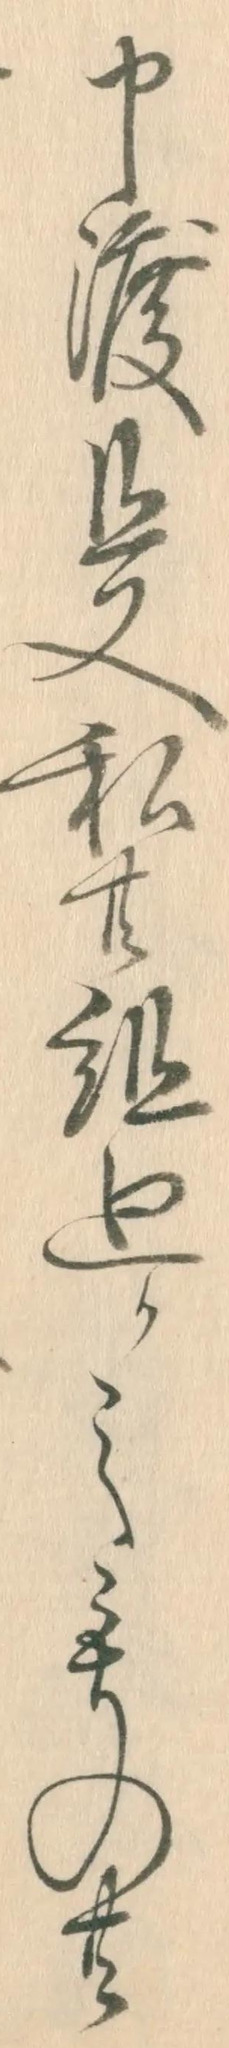申渡且又私共組廻り之もの共
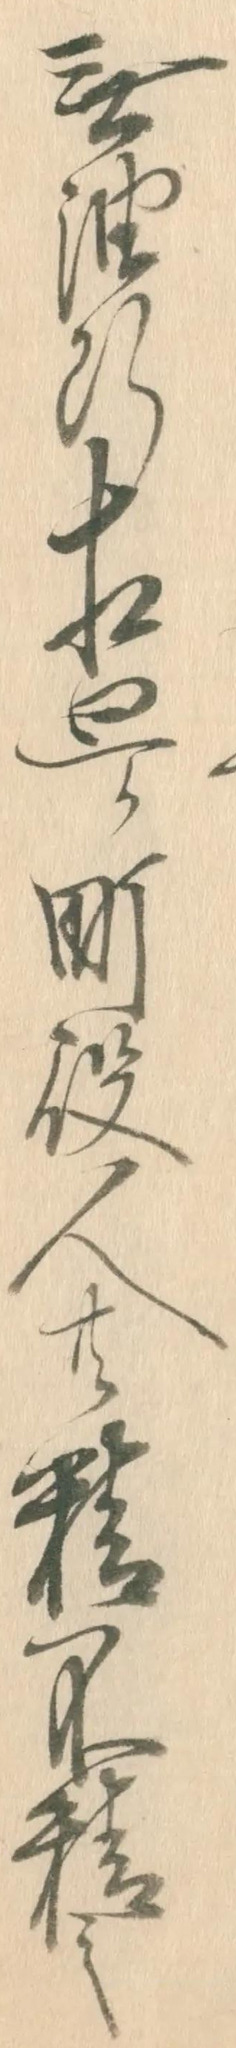無油断相廻り町役人共精不精之

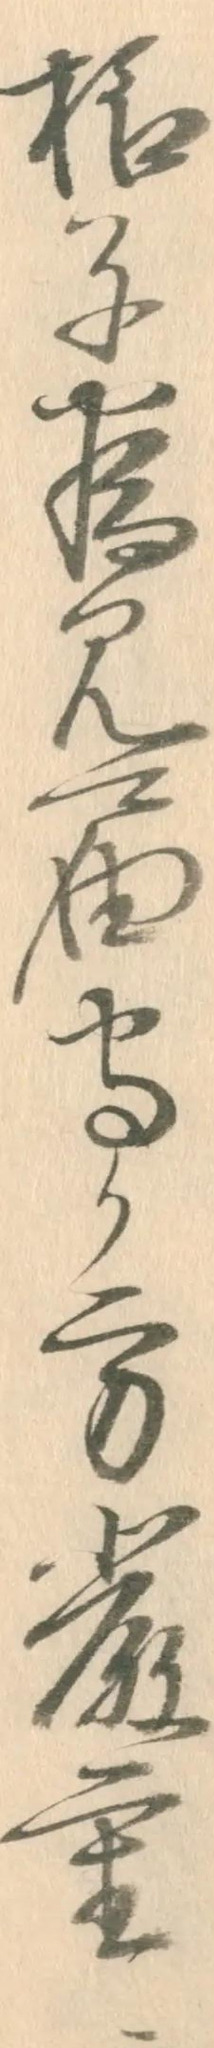様子為見届守り方厳重ニ
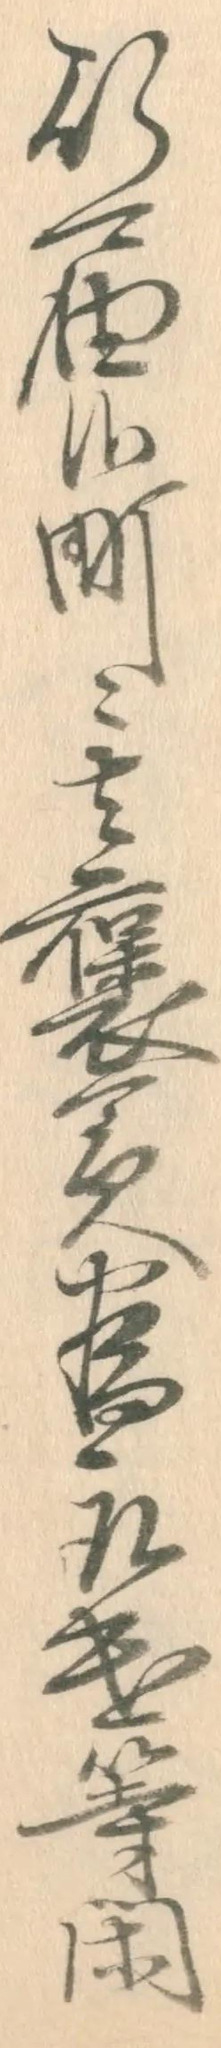行届候町ニは褒美為取遣等閑
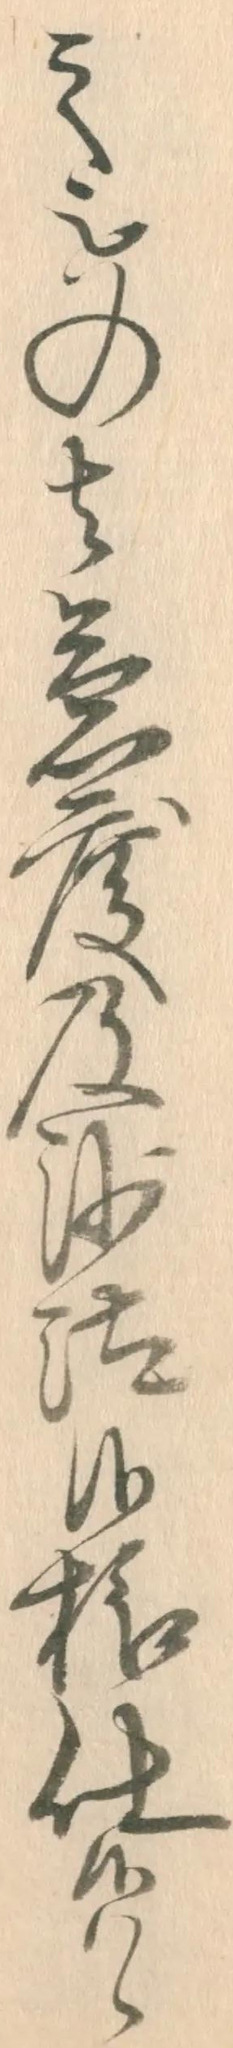之ものは急度及沙汰候様仕候ハヽ
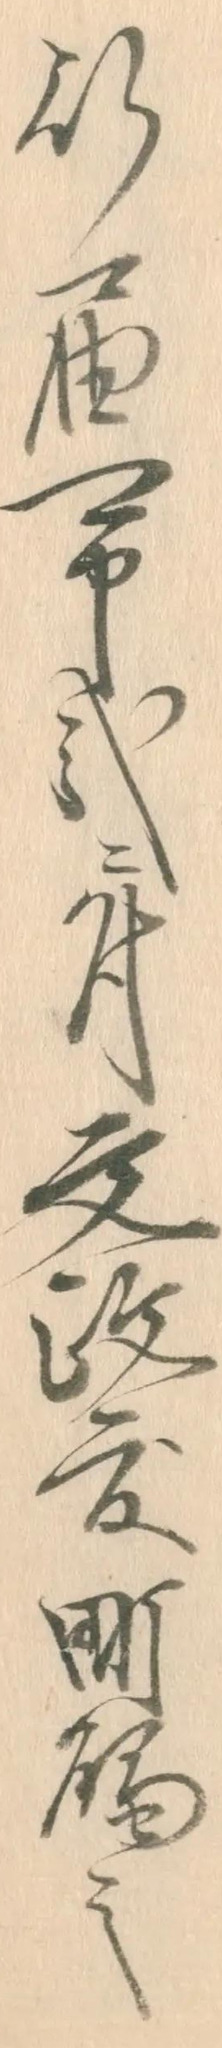行届可申哉ニ付文政度町触之
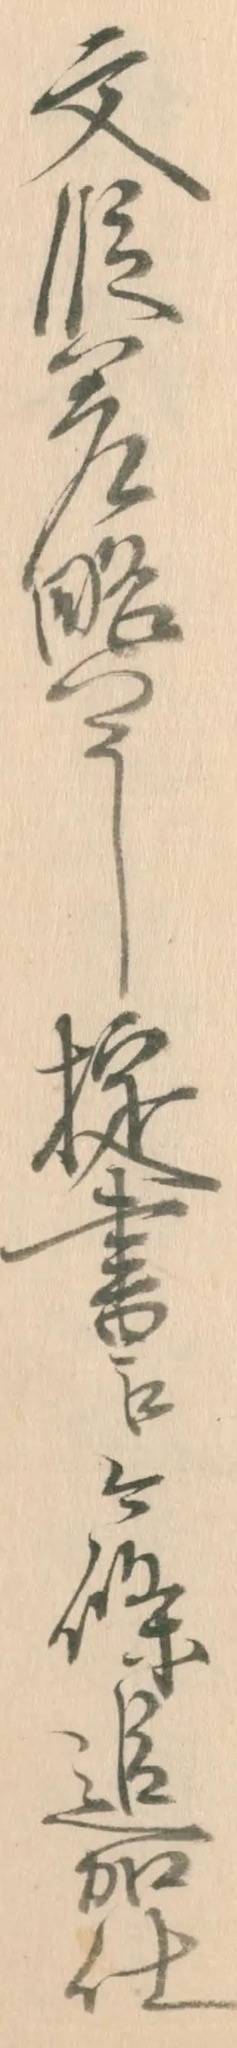文段差略いたし掟書えケ条追加仕
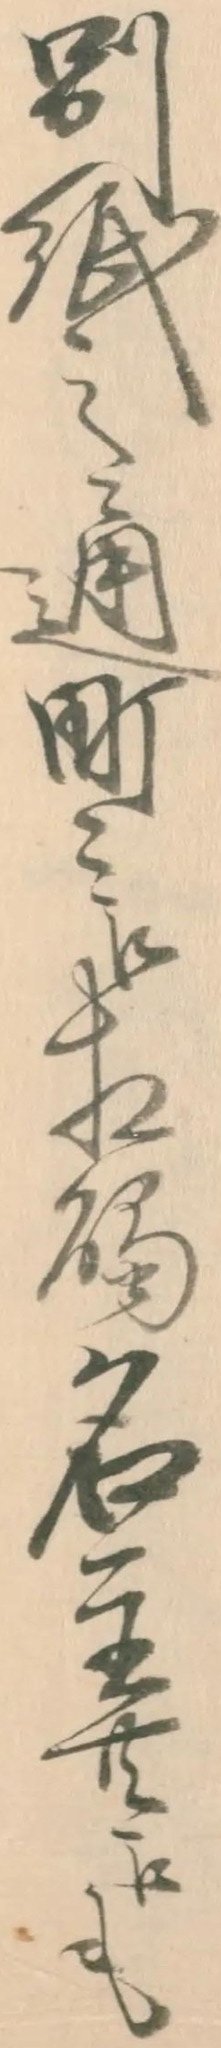別紙之通町々え相触名主共えも
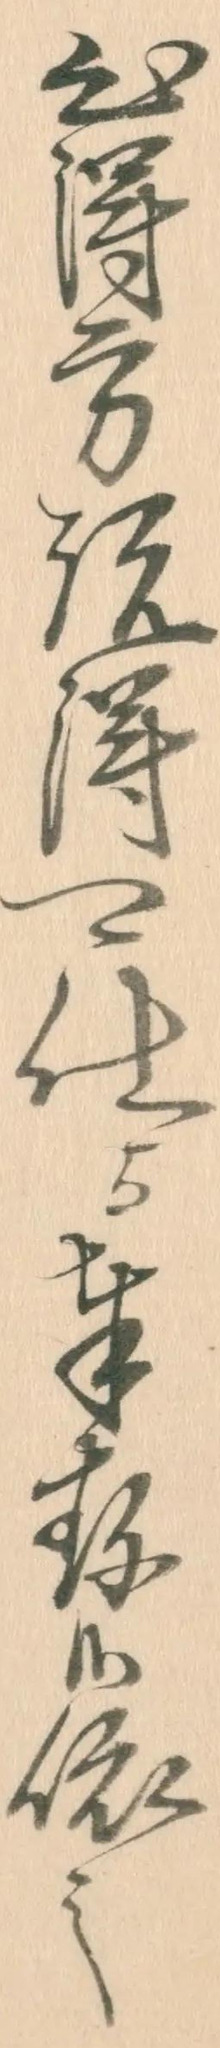心得方説得可仕と奉存候依之
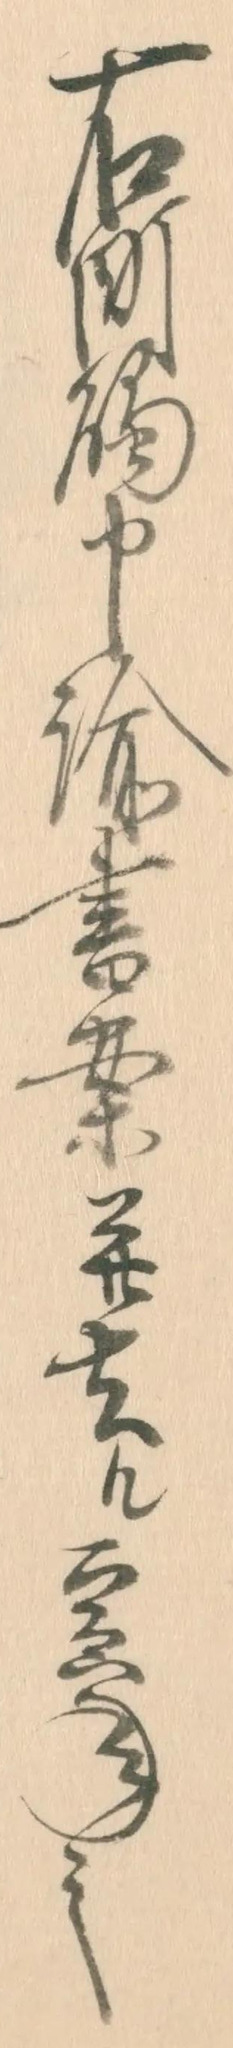右町触申諭書案并去ル寅年之
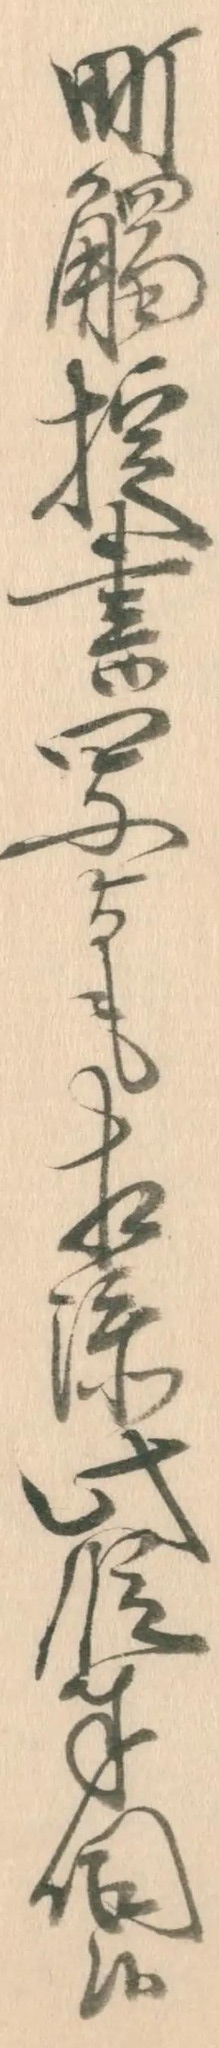町触掟書写とも相添此段奉伺候
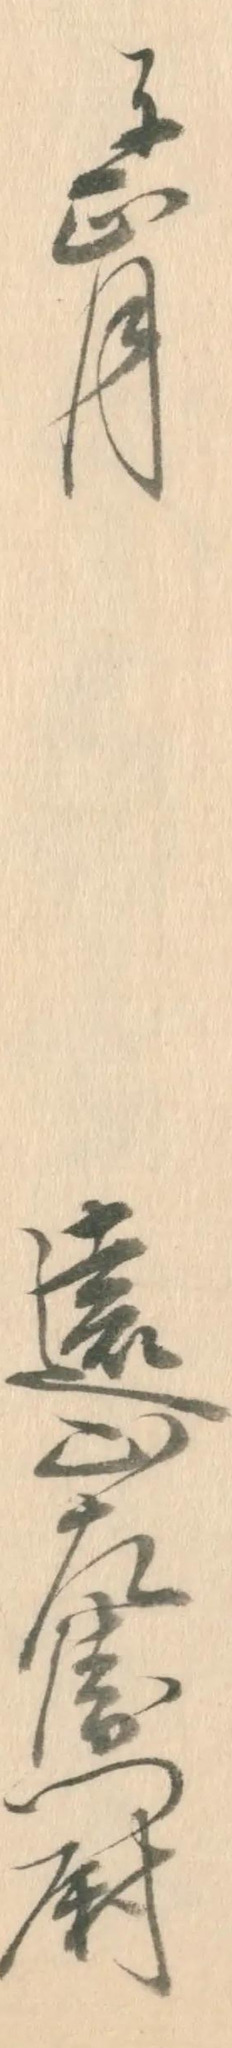子正月遠山左衛門尉

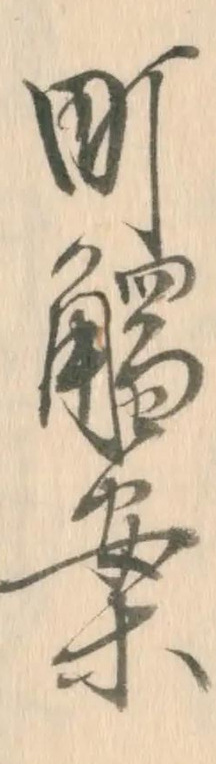町触案
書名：三橋 17巻. [7] 三橋小破御修復書留　但御奉行御掛リ替地震潰橋番屋　嘉永四亥年より安政二卯年迄　上
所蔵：国立国会図書館 National Diet Library, JAPAN
